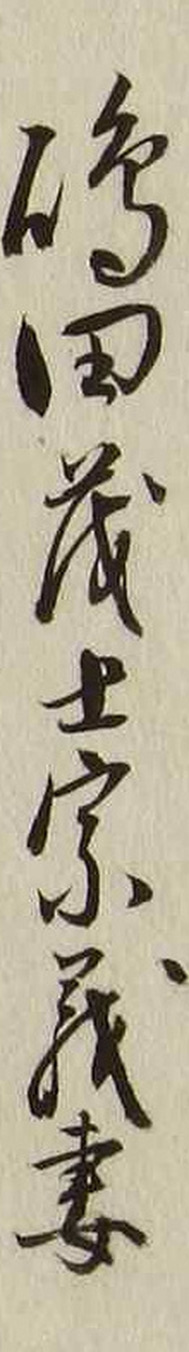女嶋田茂士宗義妻
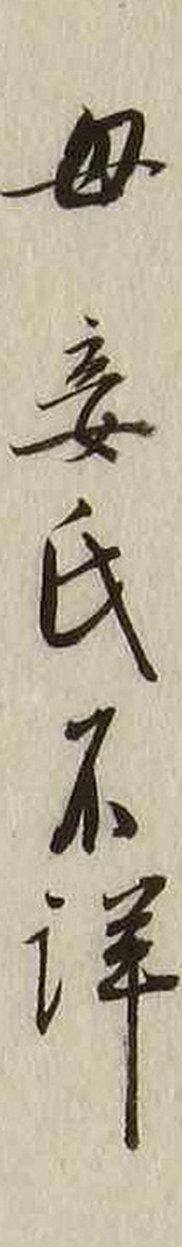母妾氏不詳
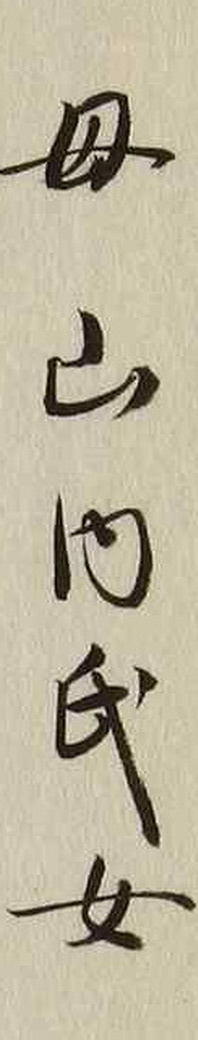母山内氏女
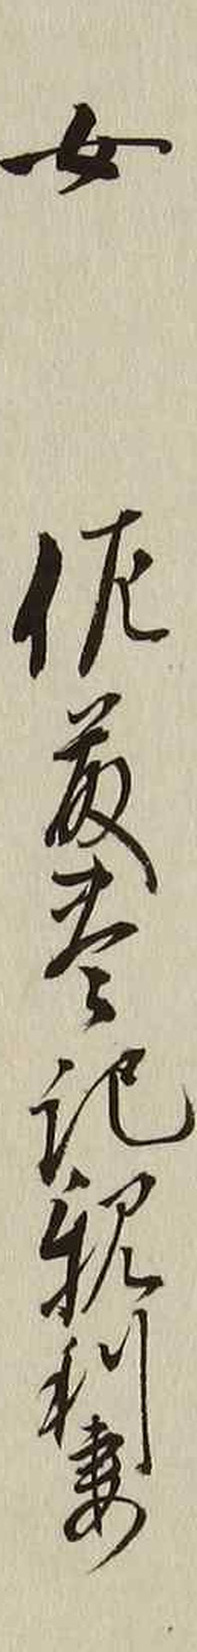女佐藤豊記親利妻
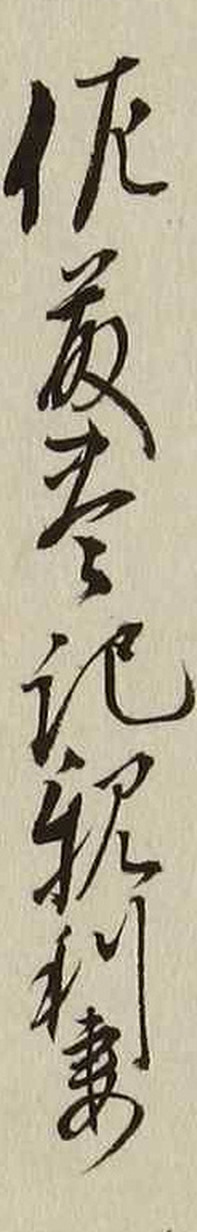女佐藤豊記親利妻
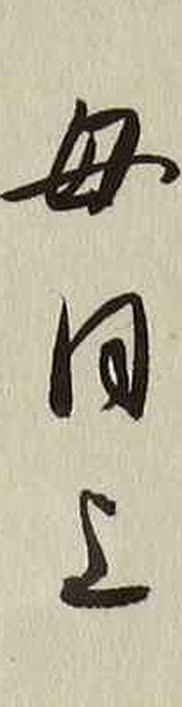母同上
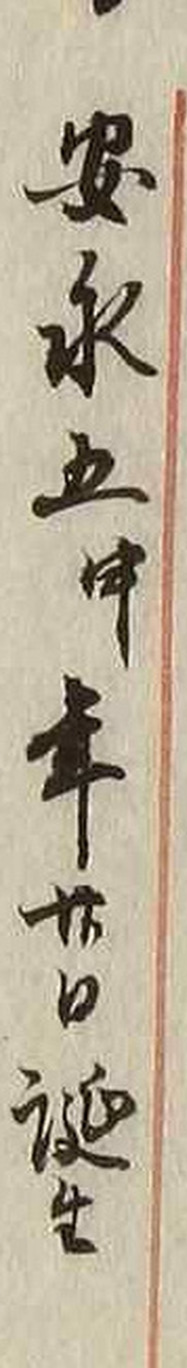安永五申年廿日誕生
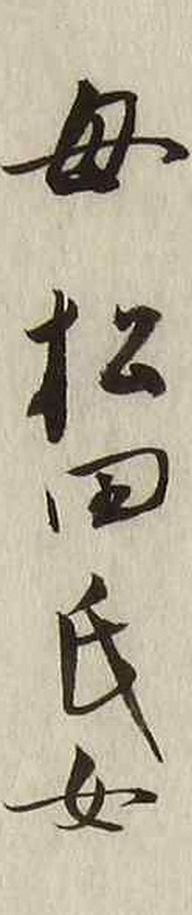母松田氏女
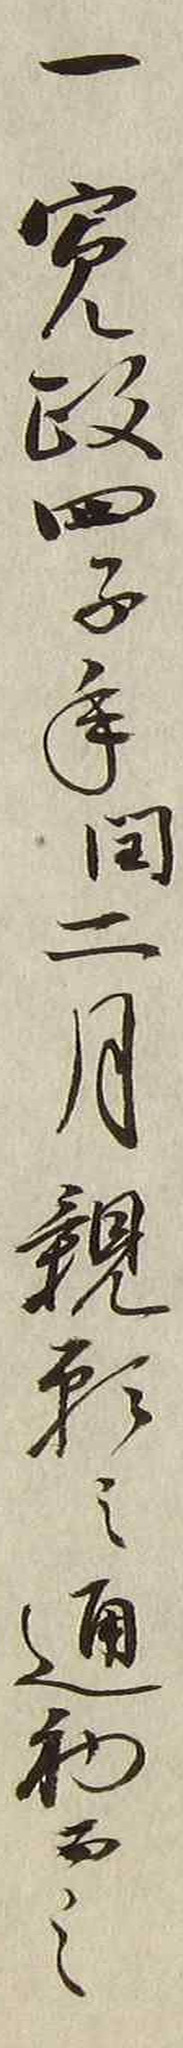一寛政四子年閏二月親願之通初而之
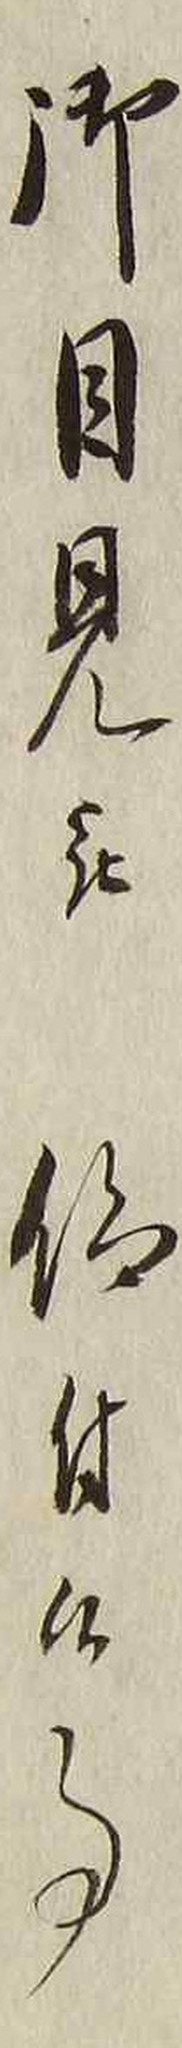御目見被仰付候事

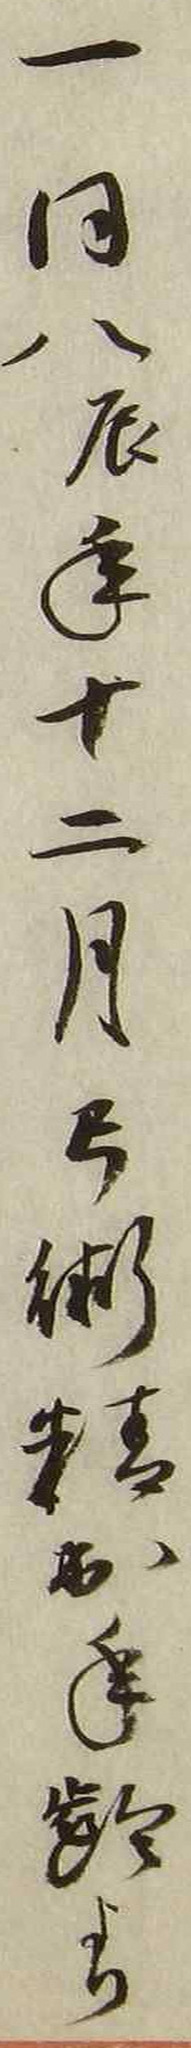一同八辰年十二月弓術精出年齢より
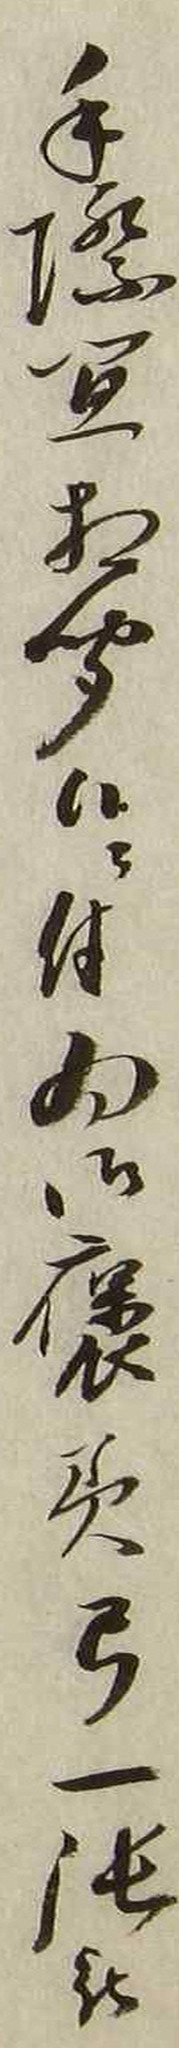手際宜相聞御ニ付為御褒美弓一張被
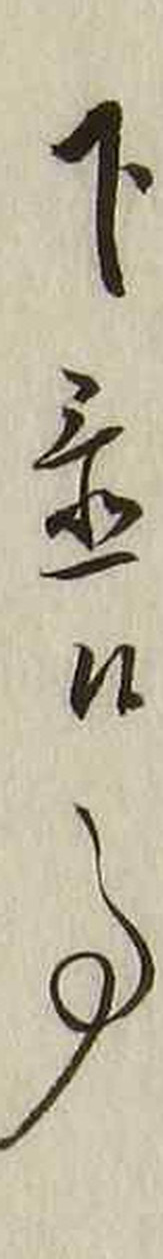下置候事
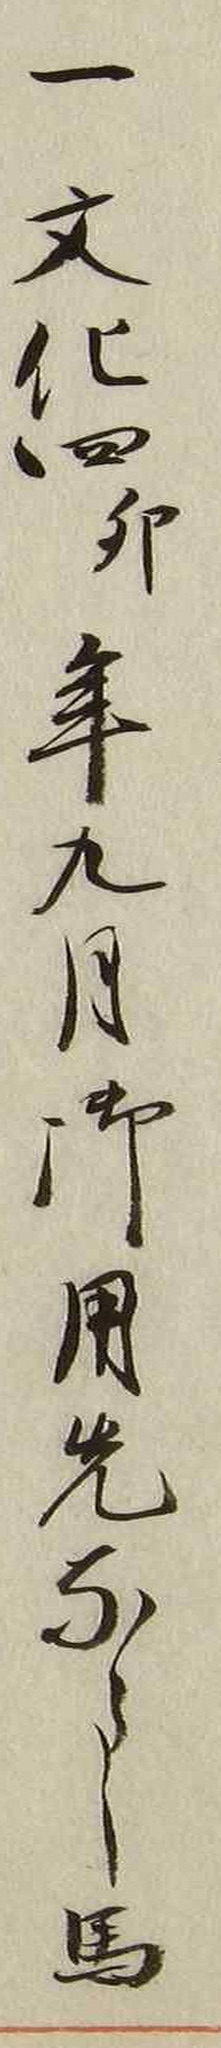一文化四卯年九月御用先ならし馬
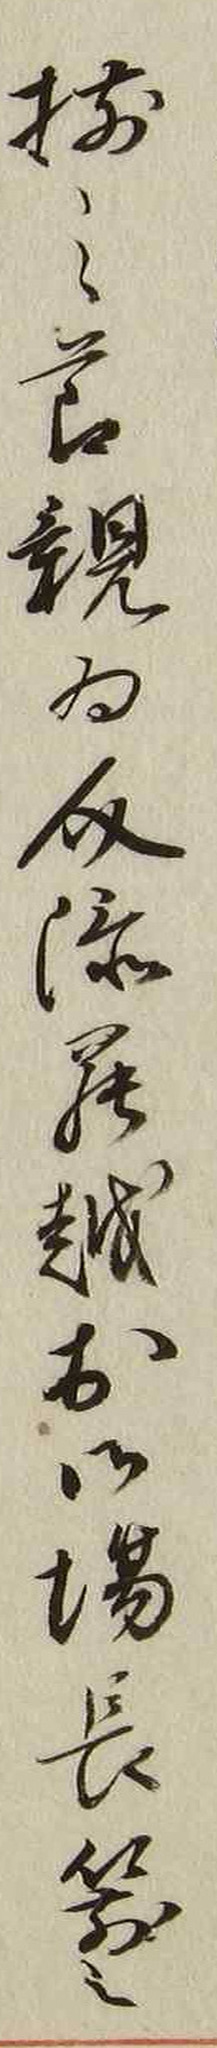揃之節親為介添罷越於御場長箭之
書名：諸士系譜　巻之22　い之部22
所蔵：会津若松市立会津図書館
